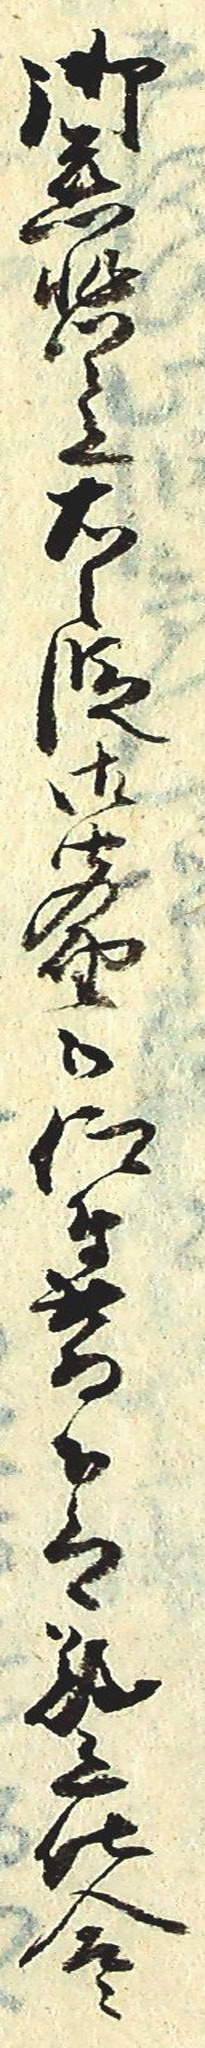御慈悲之上右之段御聞届被仰付被為下候はゝ難有仕合に
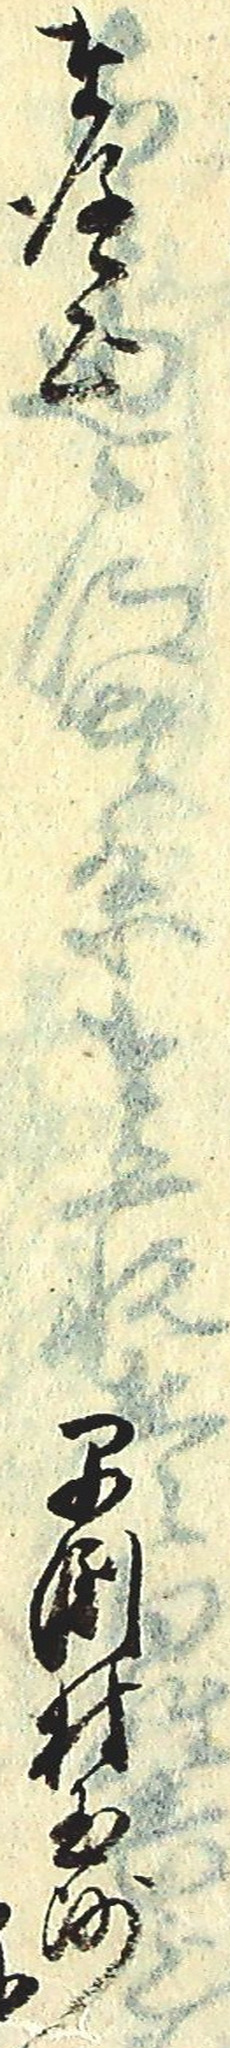奉存候以上早淵村玉師
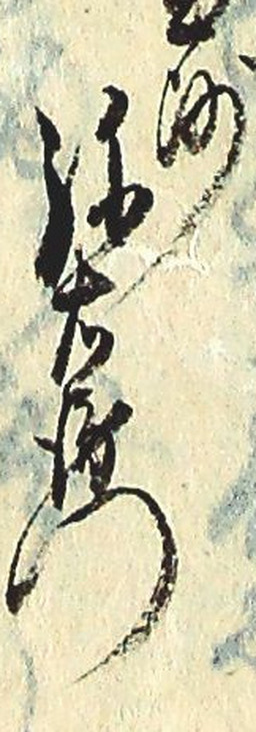弥右衛門
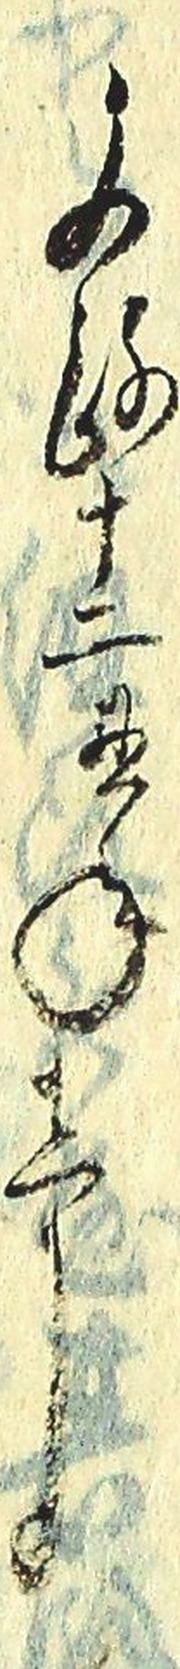文政十二丑年十二月
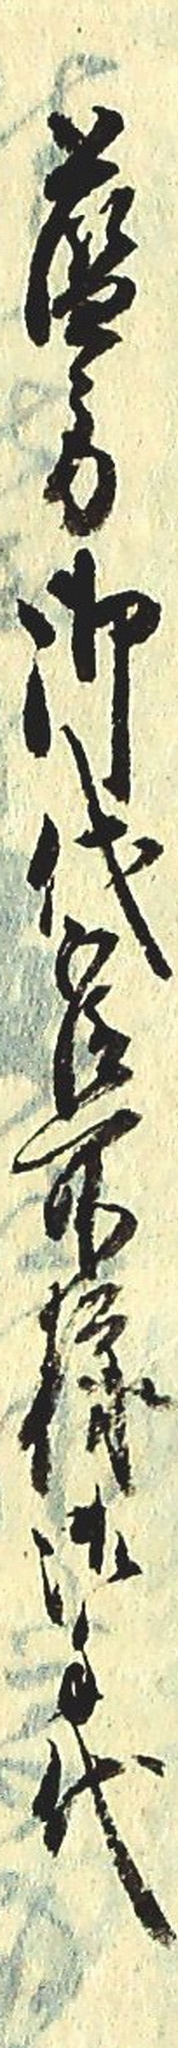藍方御代官所様御手代
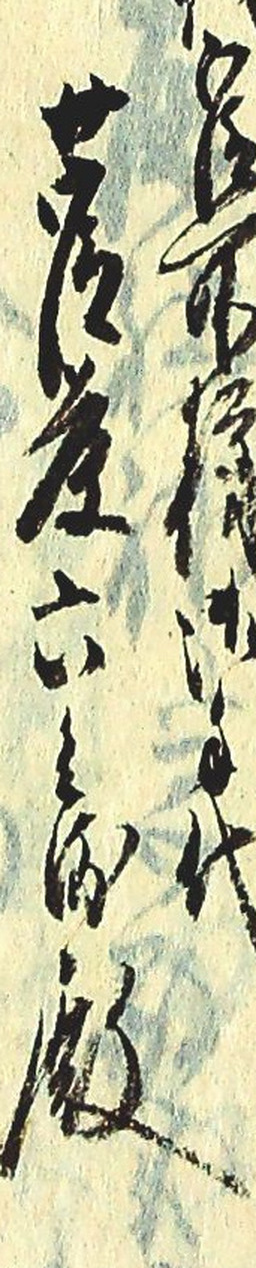菅藤六兵衛殿
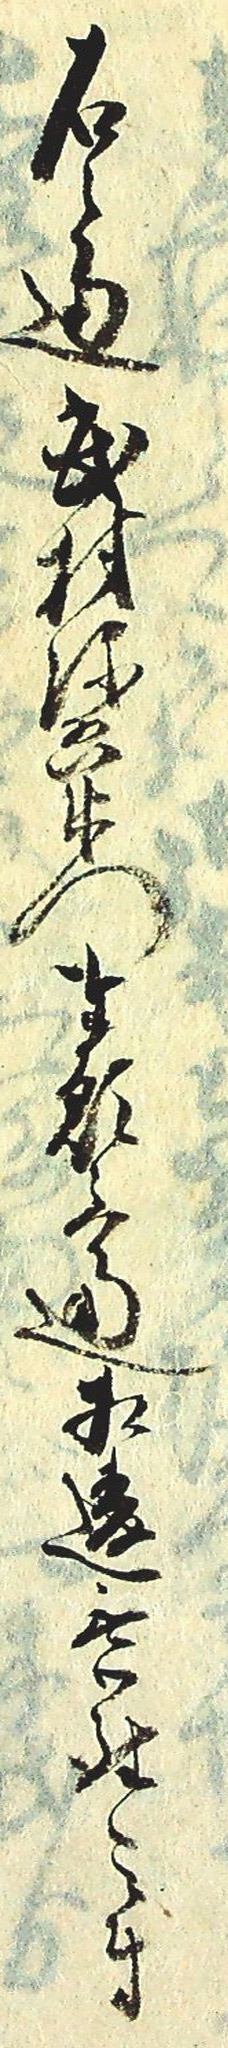右之通当村弥右衛門奉願上通相違無御座候に付
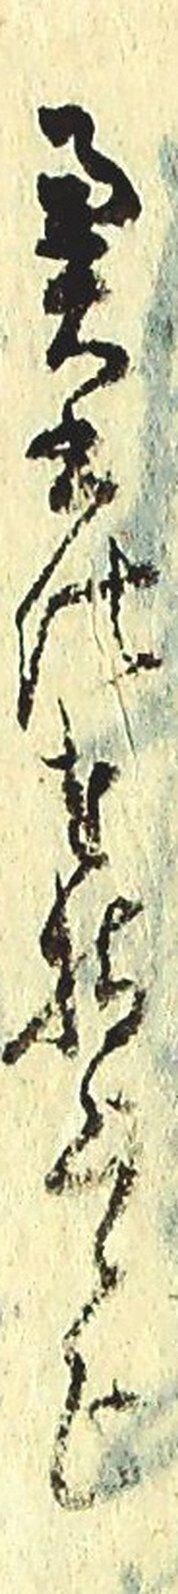奥書仕奉指上候以上
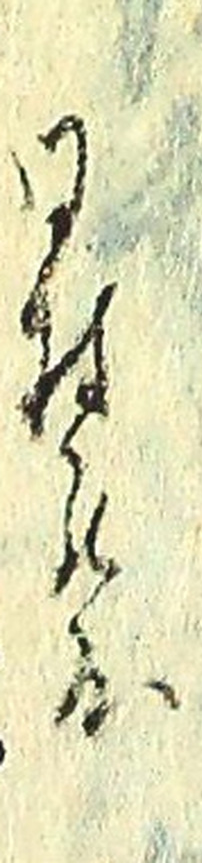同村庄屋
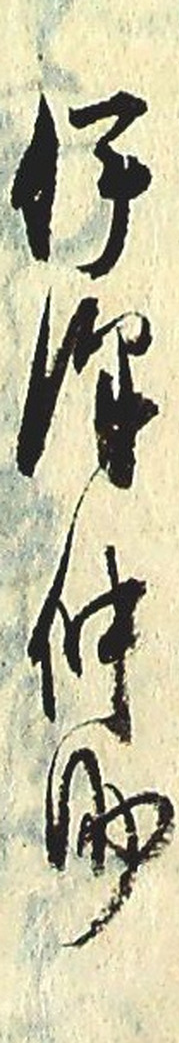伊沢仲助
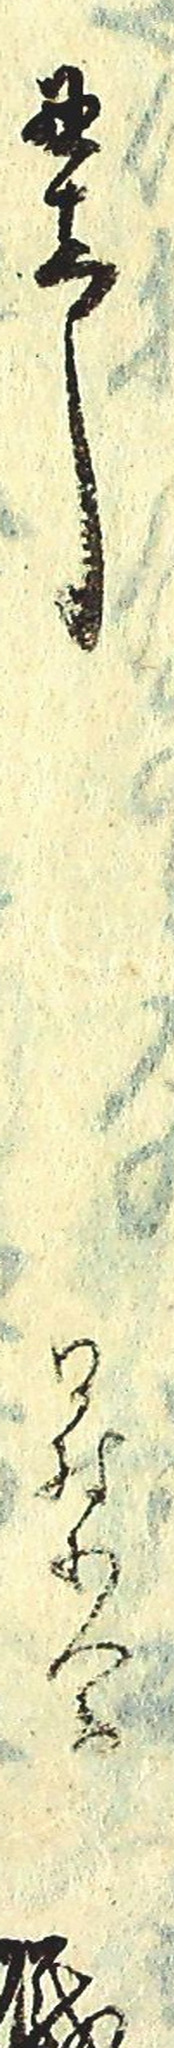丑十二月同村五人与
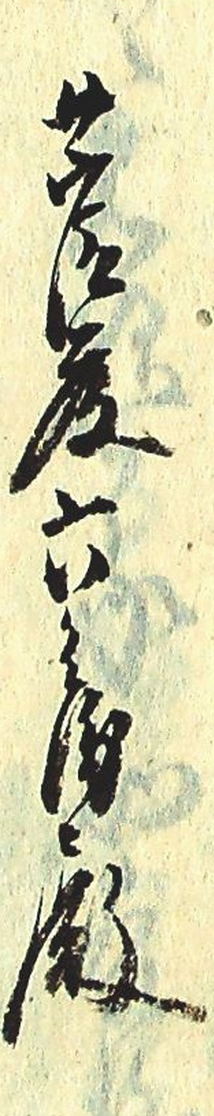菅藤六兵衛殿

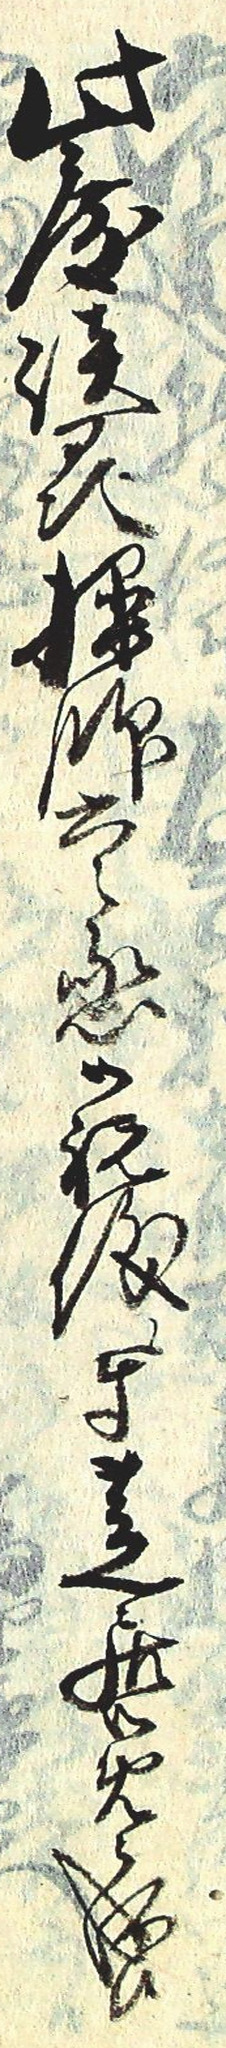此度淡州操師六之丞御祝儀に付芝居御免被成候
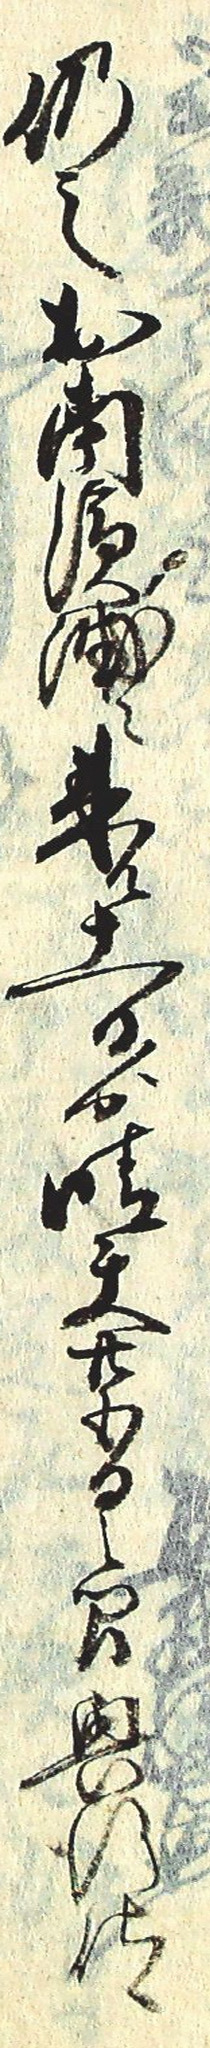仍之於南浜浦に来る十一日ゟ晴天廿五日之間興行仕候
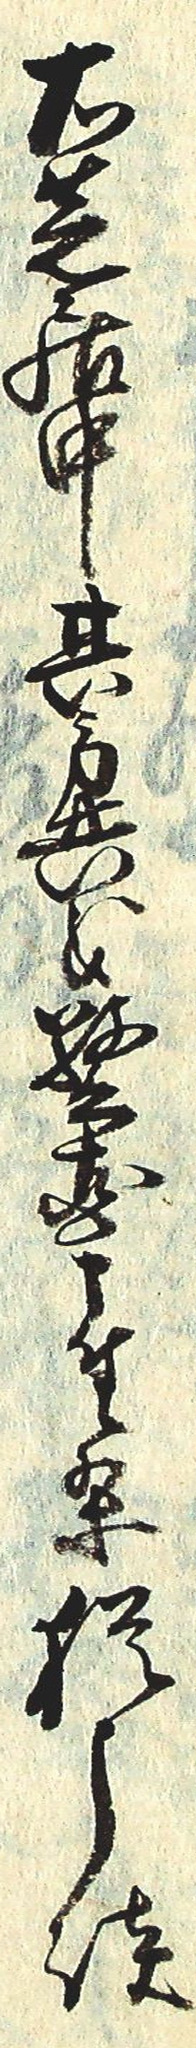右芝居中其方共義警固申付候条猶申談
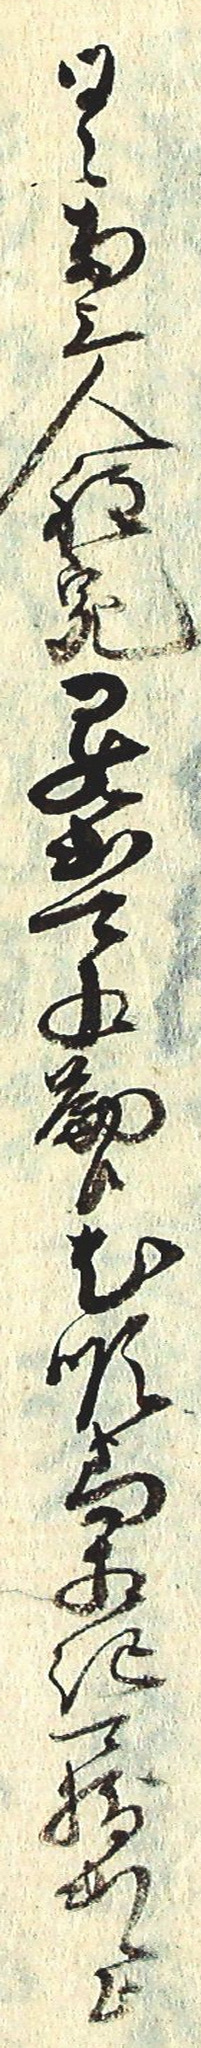日々両三人程宛罷出可相勤候尤順番相記可指出候以上
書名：諸御願書控(弐番）
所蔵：鳴門教育大学 Naruto University of Education
